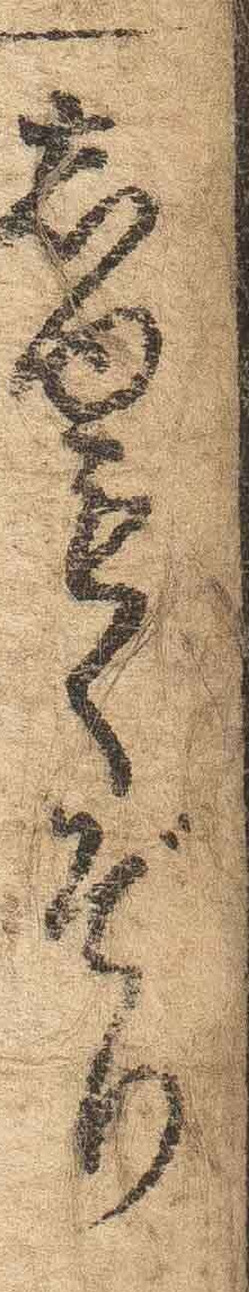しゆもくぞり
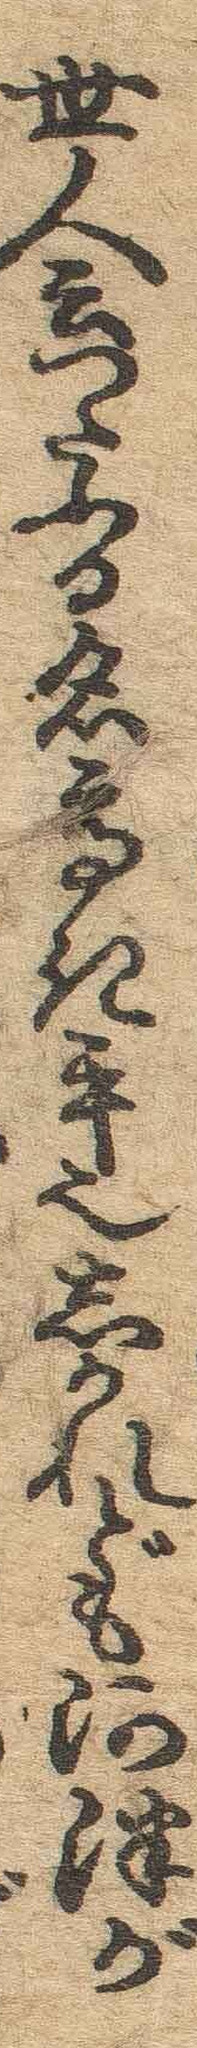世人云つたふる名髙き手也しかれども河津が
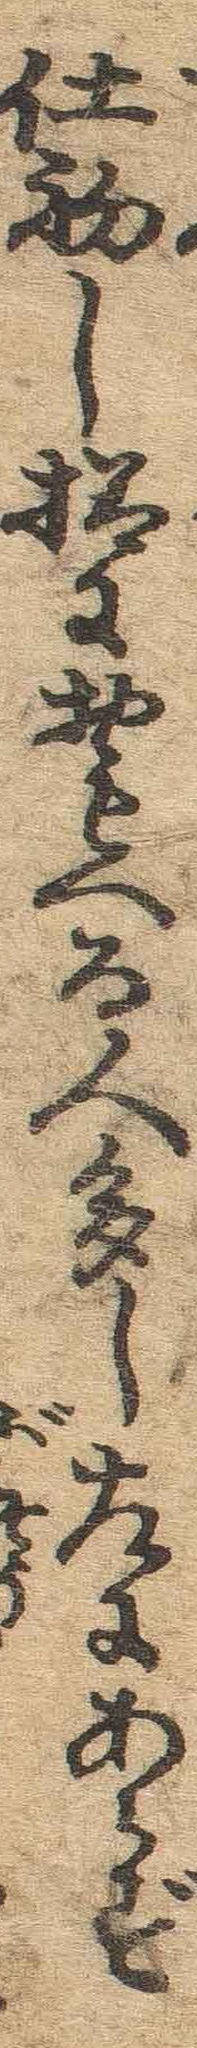仕初し様におもへる人多し左にあらず
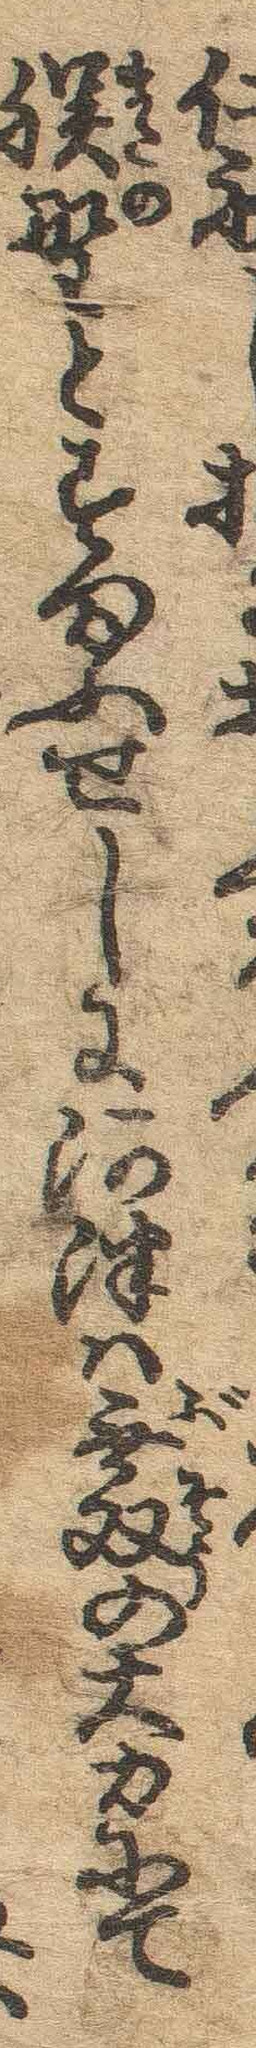俣野とすまふせしに河津は無双の大力にて
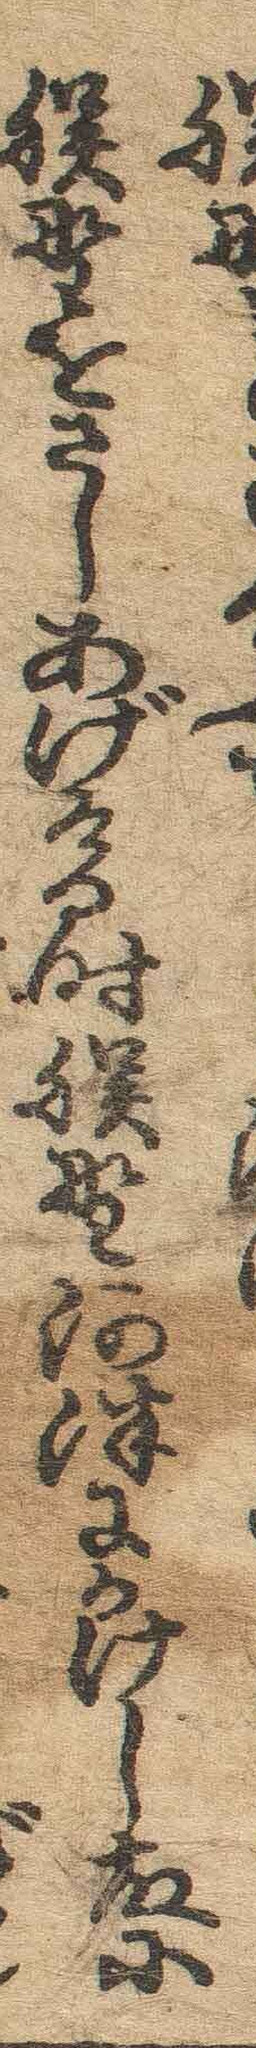俣野をさしあげける時俣野河津にかけし故に
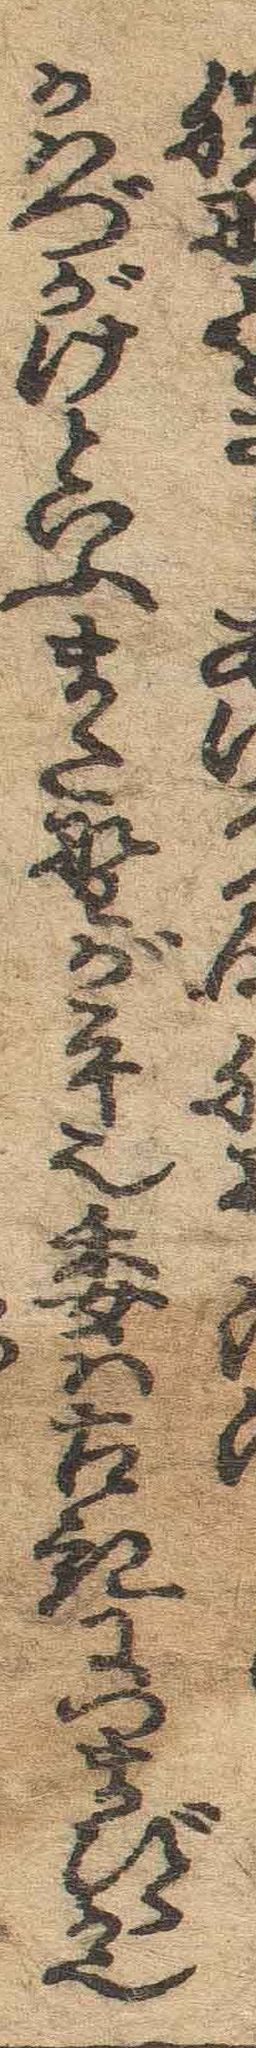かはづかけといふまた野が手也委は古記につまびらか也
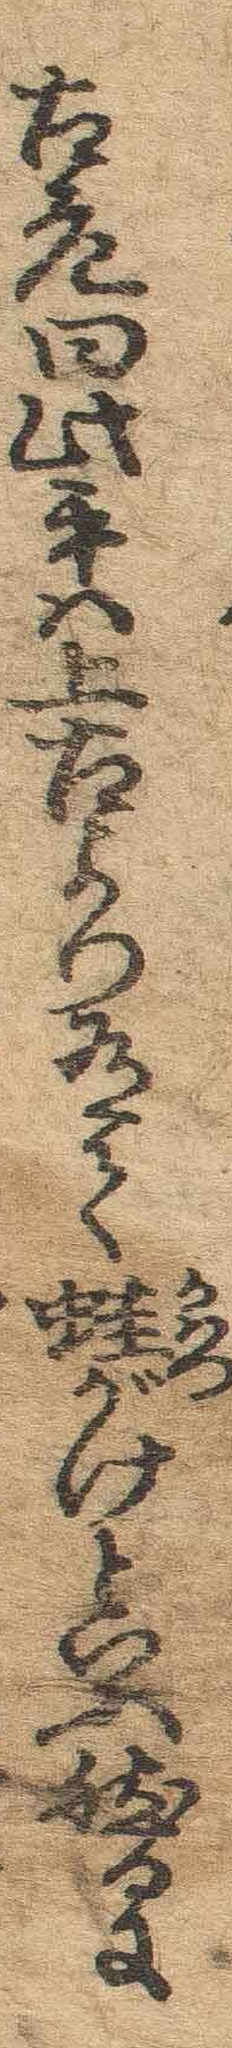古老曰此手は上古より有て蛙がけといふ然るに
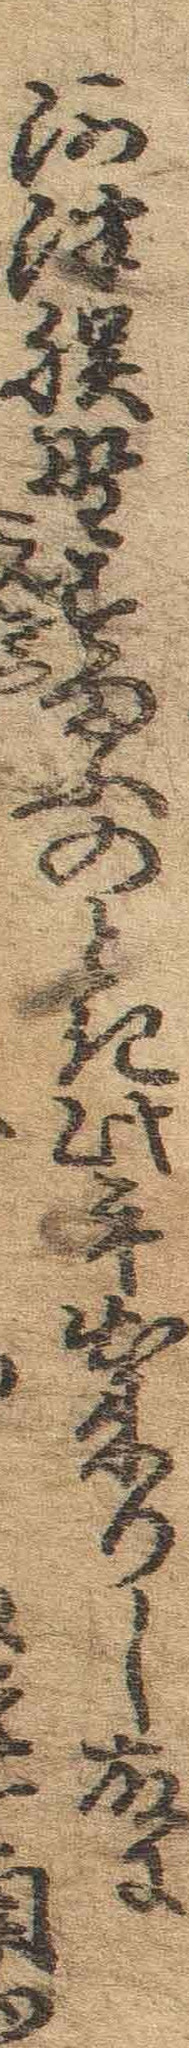河津俣野すまふのとき此て出来りし故に

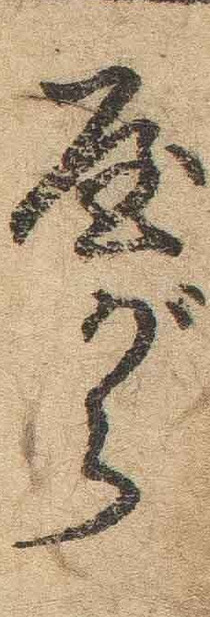屋がら
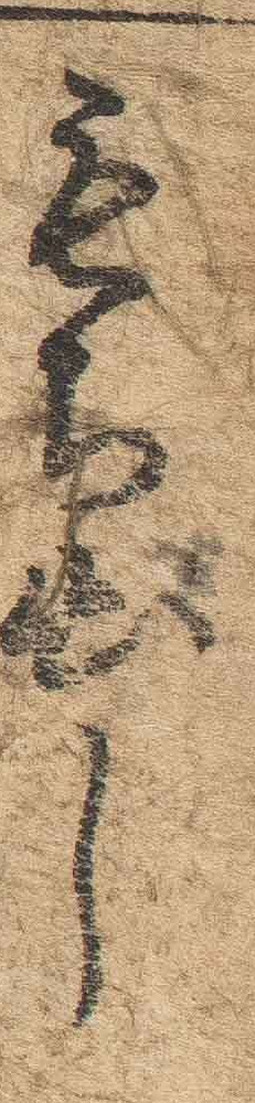もち出し
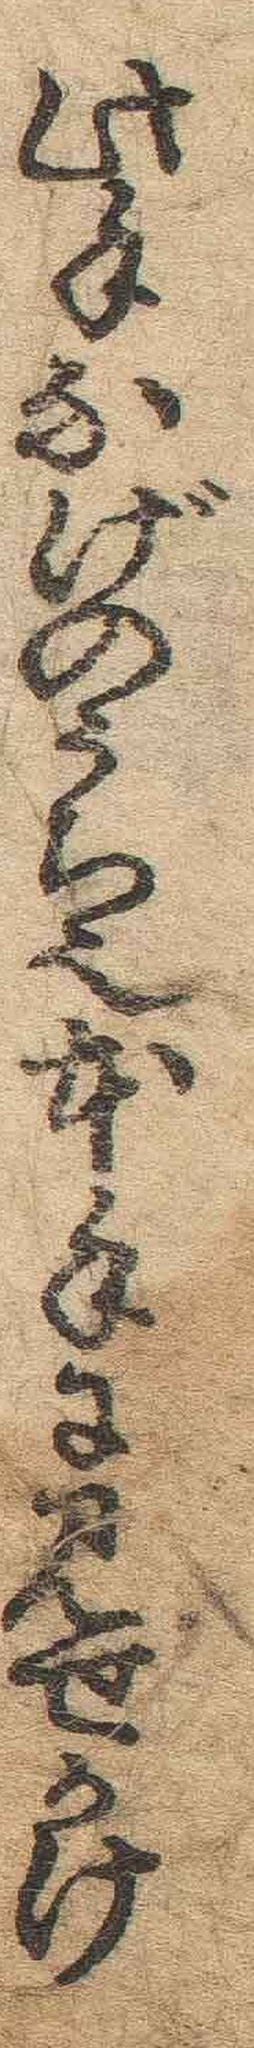此手なげのうち也本手に見せかけ
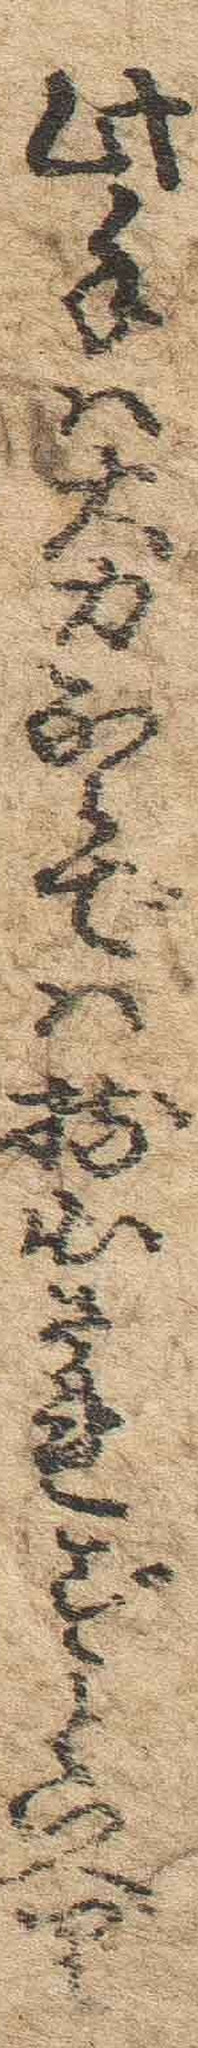此手は大力ならでは持出されずといへり
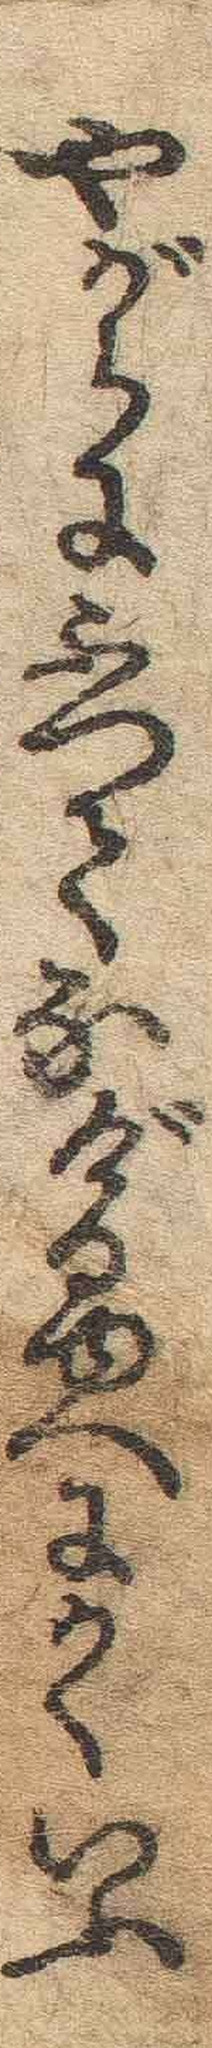やがらになつてなげるゆへにかくいふ
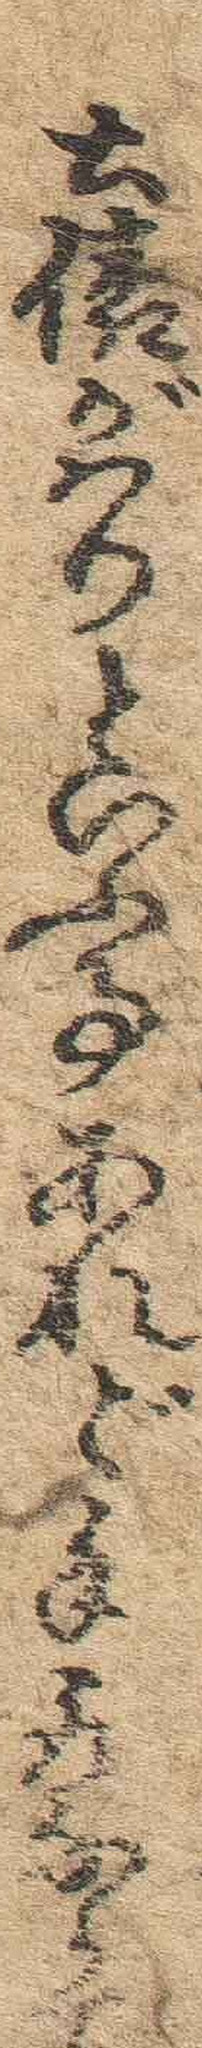土俵がはりといふ事あれど手取ならでは
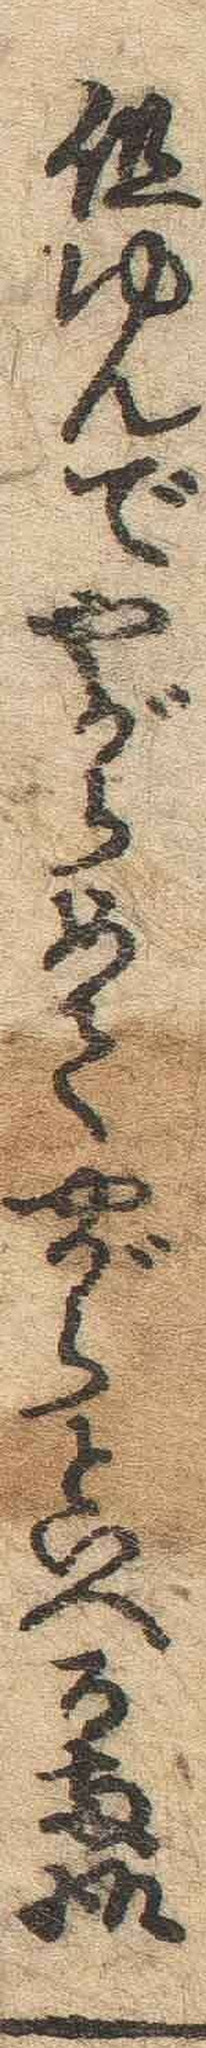但ゆんでやがらめてやがらといへり両派有
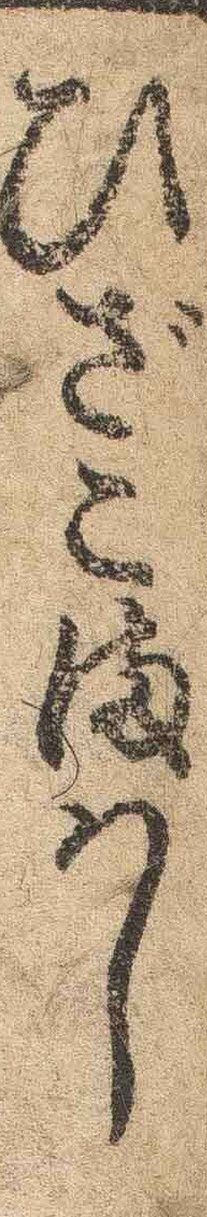ひざこまはし
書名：古今相撲大全
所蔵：東京学芸大学附属図書館 国文学研究資料館
